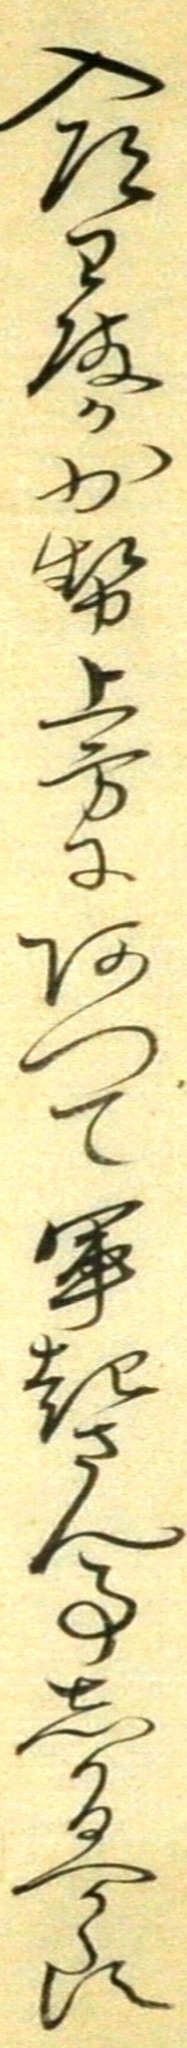入道わ殿か加勢上方にあつて軍起さん事しかるへからす
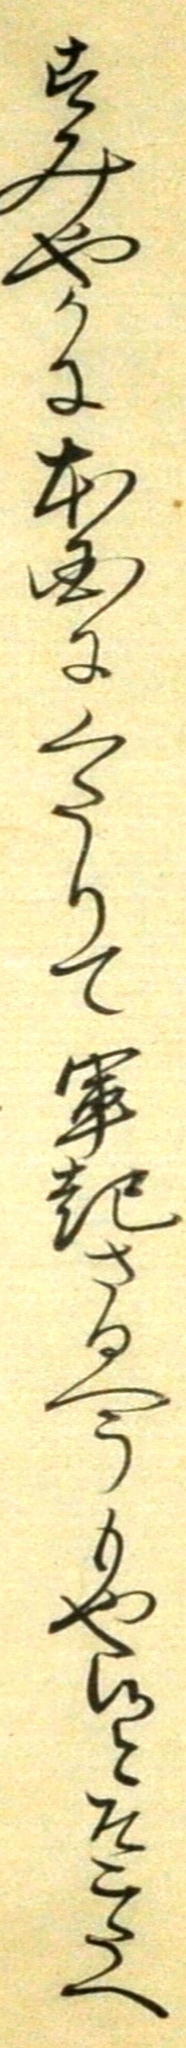すみやかに本国にくたりて軍起さるへうもや候とそこたへ
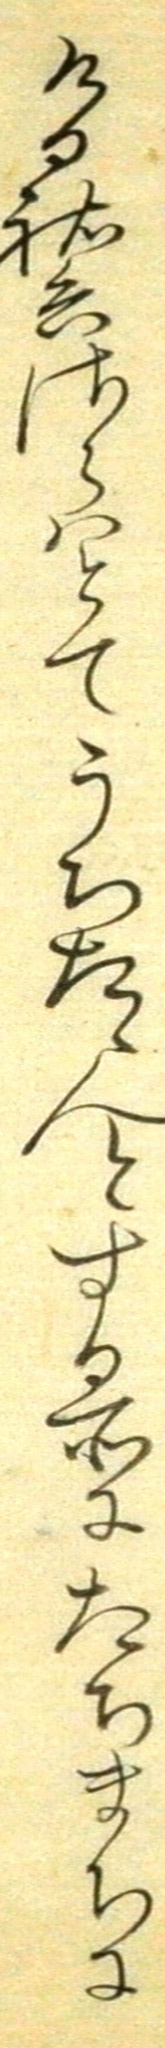ける祐兵さらはとてうちたゝんとする所にたちまちに
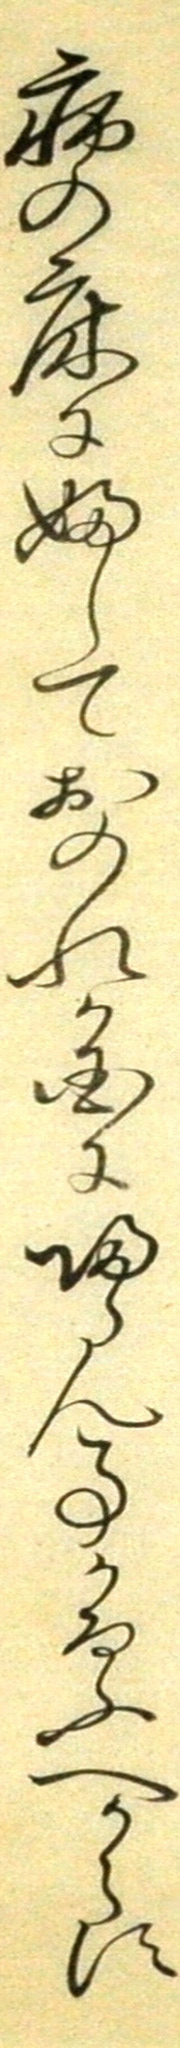病の床にふしておのれか国に帰らん事かなふへからす
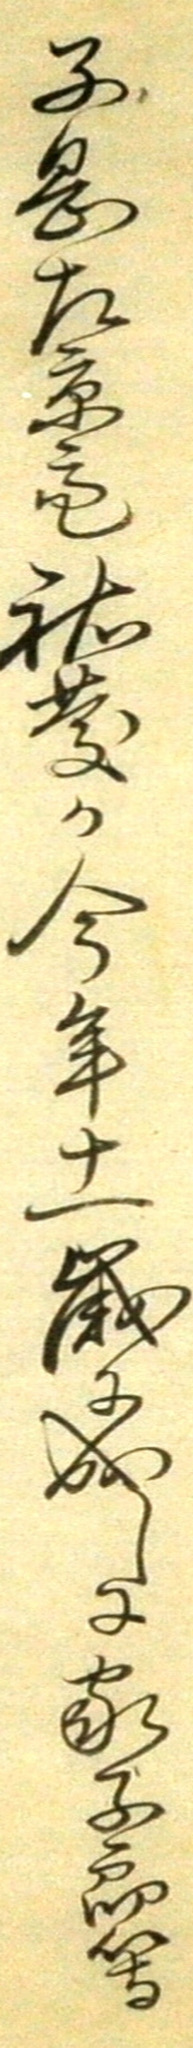子息左京亮祐慶か今年十一歳に成しに家子郎等
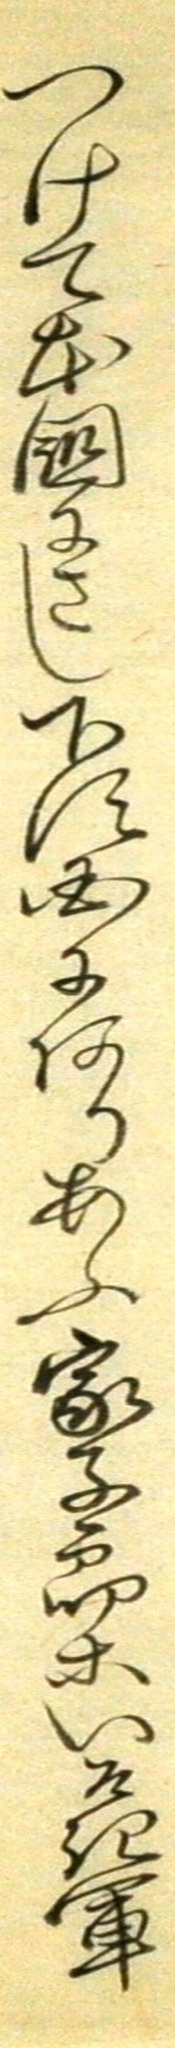つけて本国にさし下す国にありあふ家子郎等いそき軍
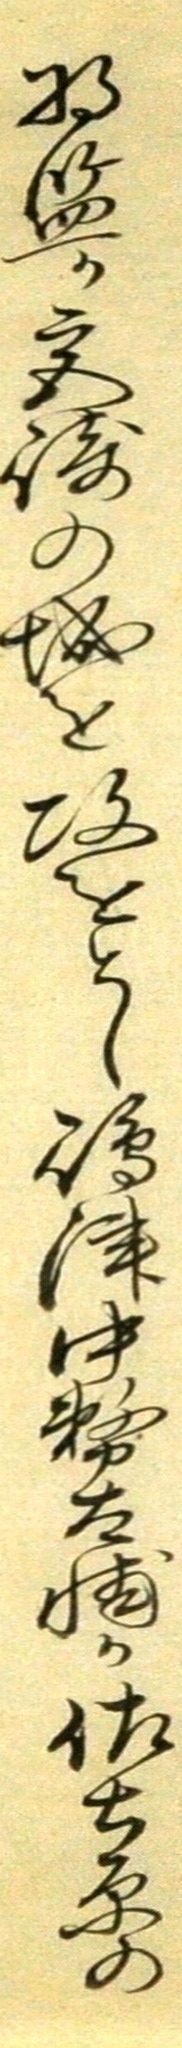将監か宮崎の城を攻をとし島津中務太輔か佐土原の
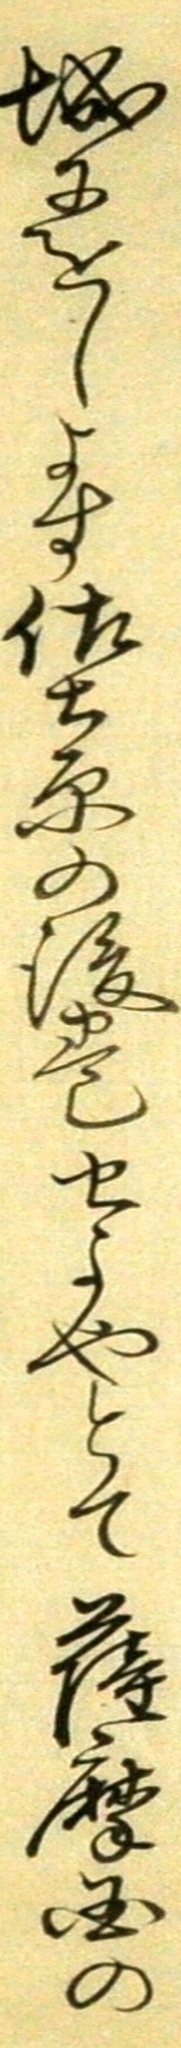城にをしよす佐土原の後巻せよやとて薩摩国の
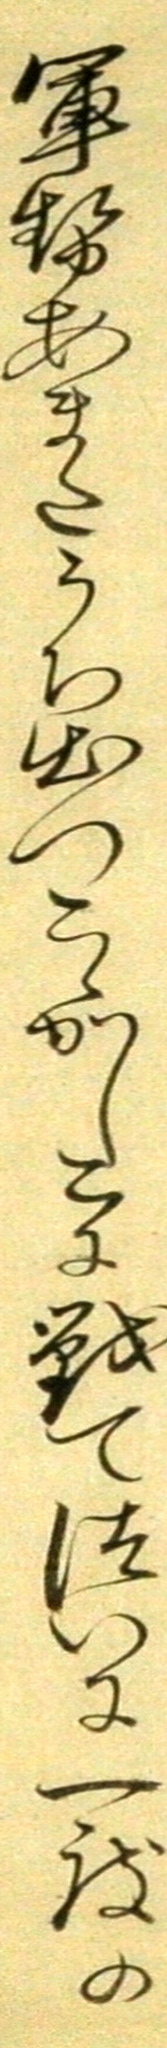軍勢あまたうち出つこゝかしこに戦てついに一度の
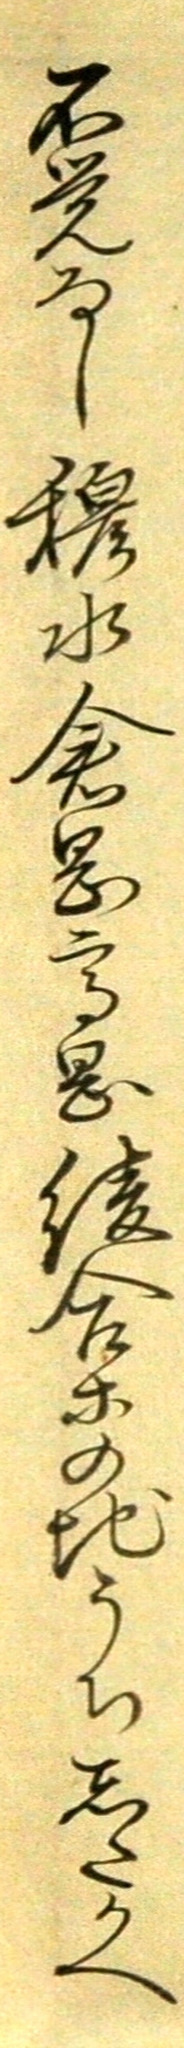不覚なし穆水倉岡高岡綾合等の地うちしたかへ

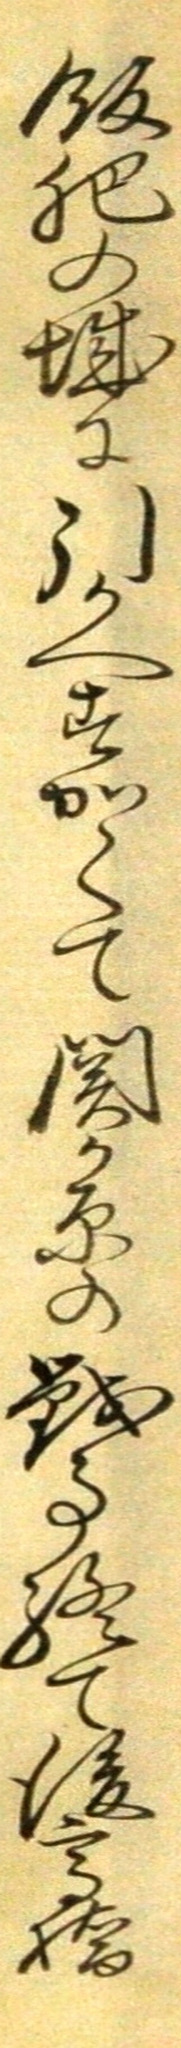飫肥の城に引かへすかくて関か原の戦事経て後高橋
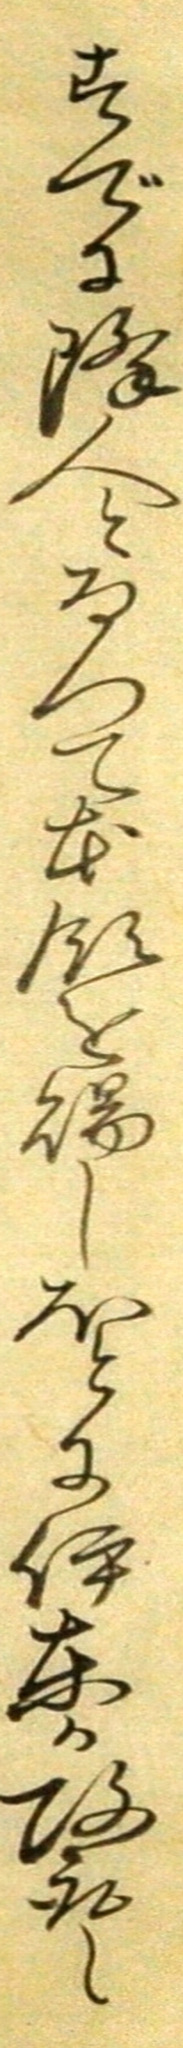すでに降人となつて本領を賜しほとに伊東か攻取し
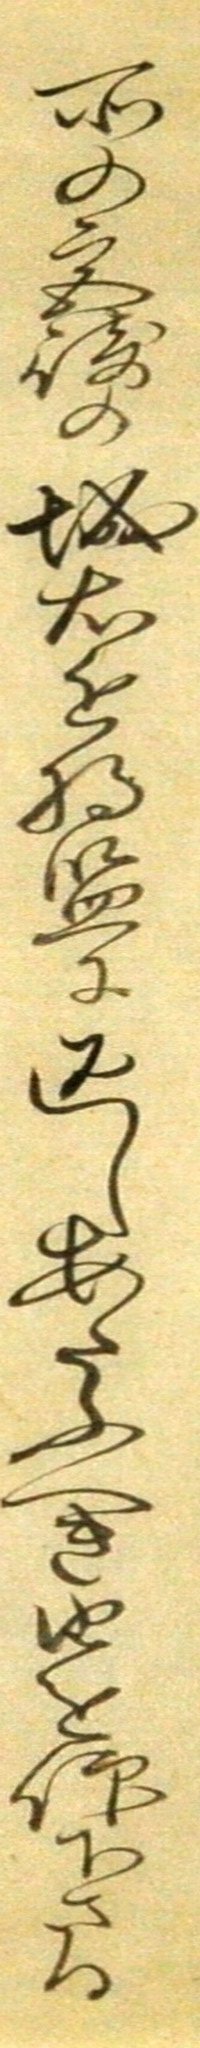所の宮崎の城右近将監に返しあたふへき由を仰下さる
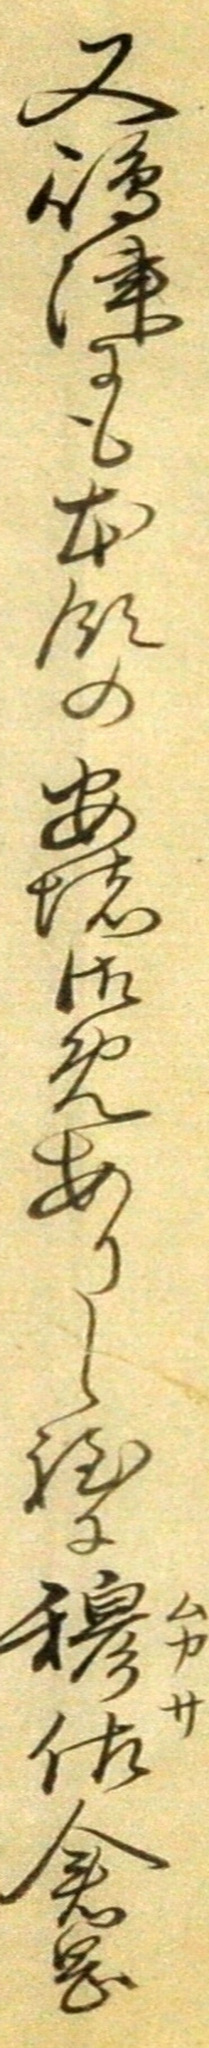又島津にも本領の安堵御免ありし程に穆佐倉岡
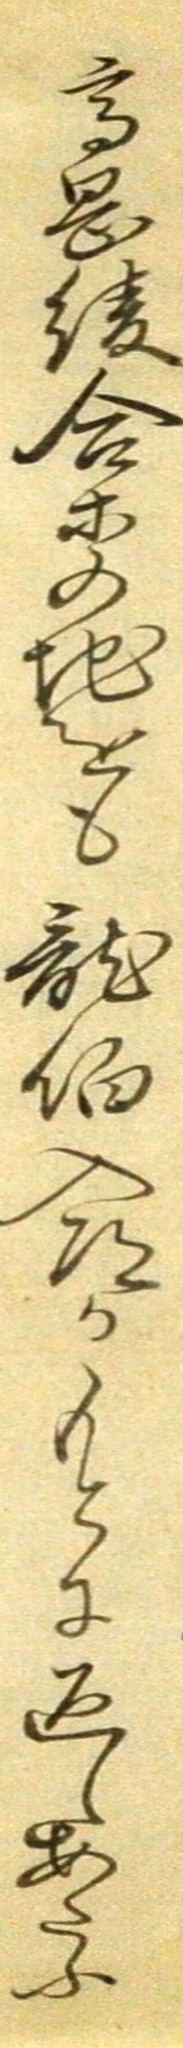高岡綾合等の地をも龍伯入道かもとに返しあたふ
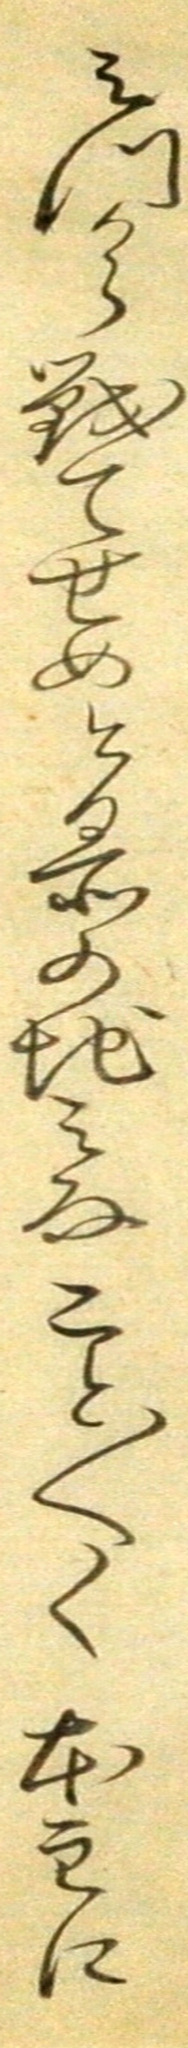みつから戦てせめとる所の地みなこと〳〵く本主に
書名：藩翰譜（九・下）
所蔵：伊那市立高遠町図書館・合同会社AMANE
